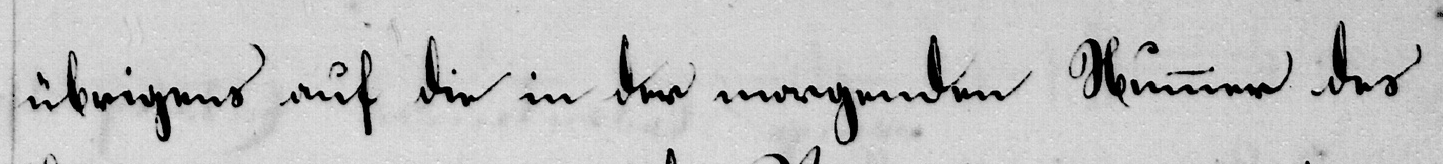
übrigens auf die in der morgenden Nummer des
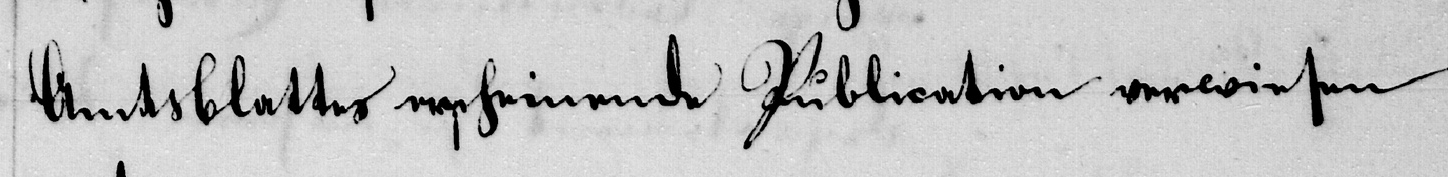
Amtsblattes erscheinende Publication verwiesen
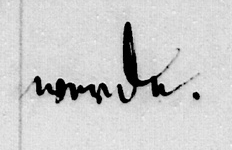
werde.
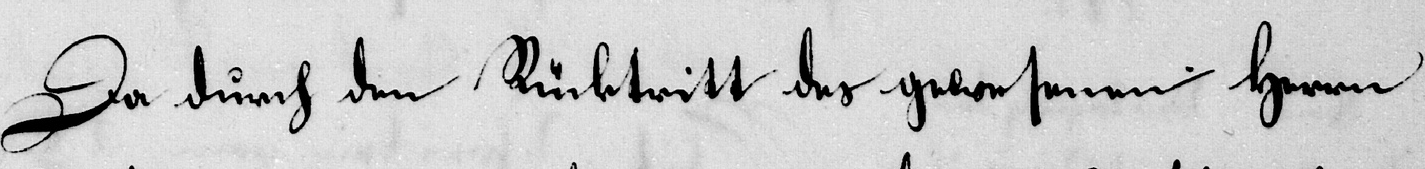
Da durch den Rücktritt des gewesenen Herrn
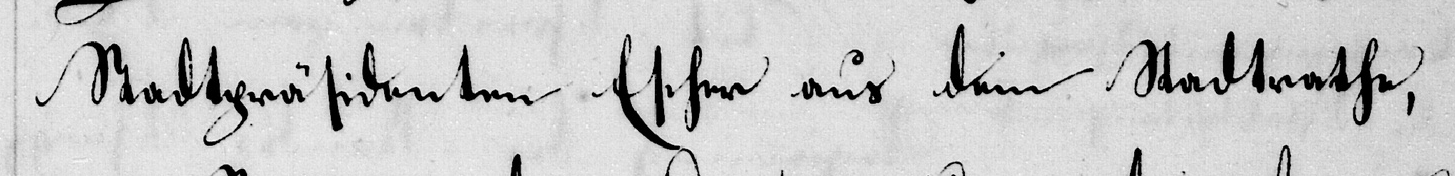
Stadtpräsidenten Escher aus dem Stadtrathe,
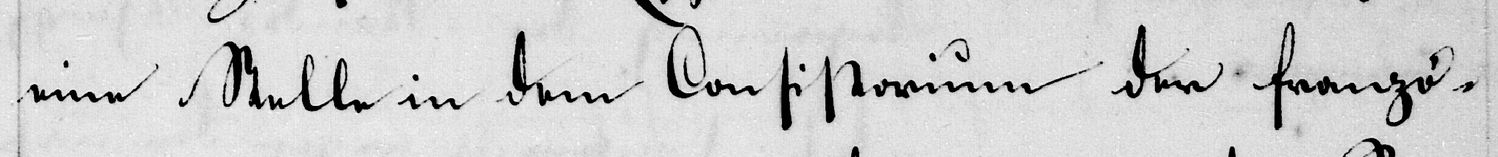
eine Stelle in dem Consistorium der franzö¬
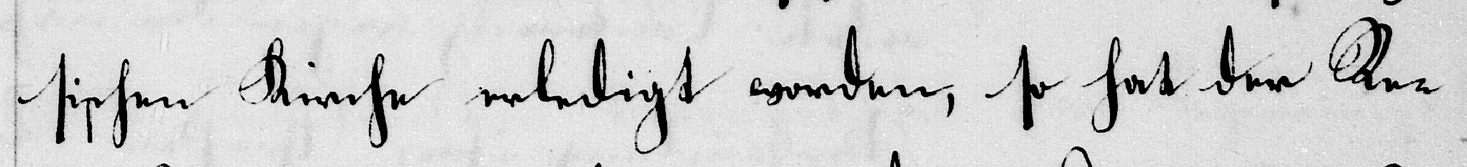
sischen Kirche erledigt worden, so hat der Re¬
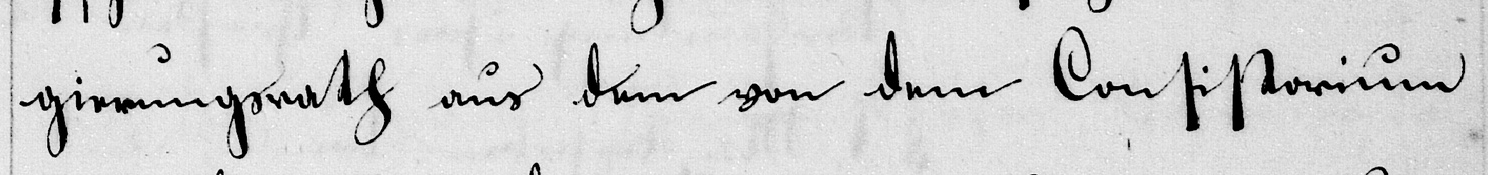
gierungsrath aus dem von dem Consistorium
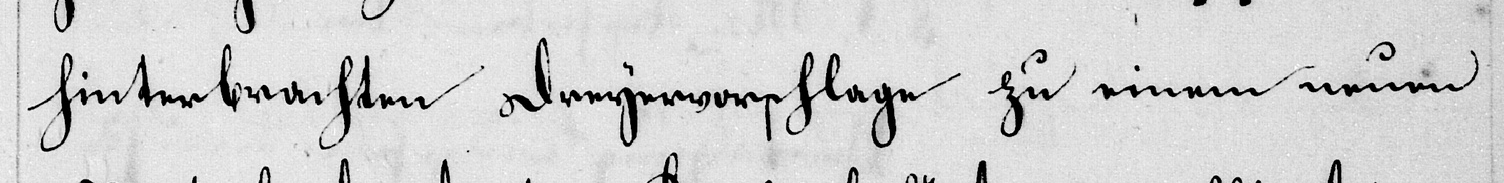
hinterbrachten Dreyervorschlage zu einem neuen
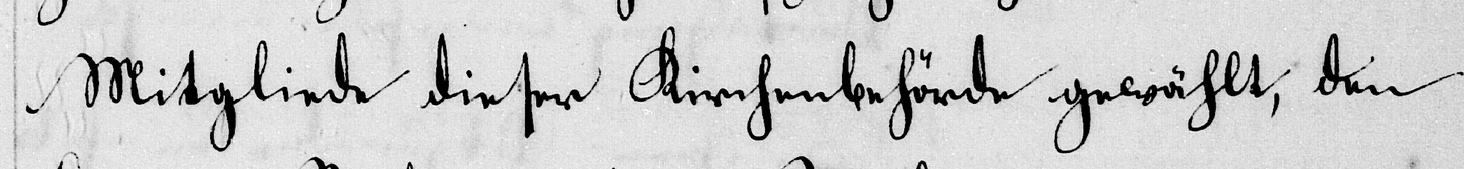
Mitgliede dieser Kirchenbehörde gewählt, den
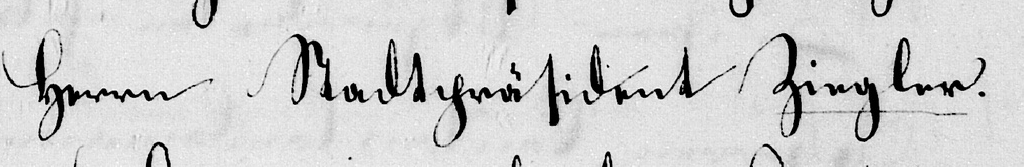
Herrn Stadtpräsident Ziegler.
